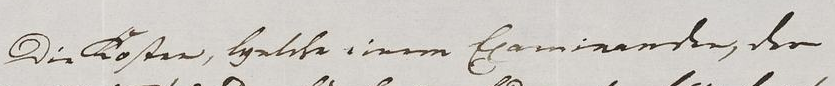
Die Kosten, welche einem Examinanden, der
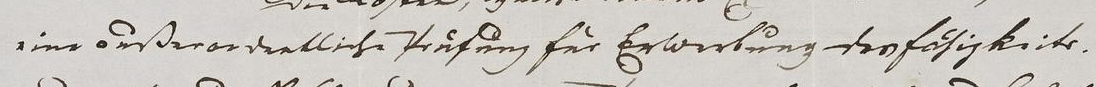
eine außerordentliche Prüfung für Erwerbung des Fähigkeits-
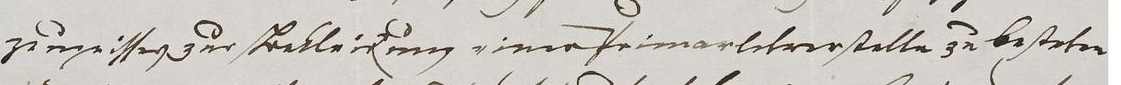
zeugnisses zur Bekleidung einer Primarlehrerstelle zu bestehen
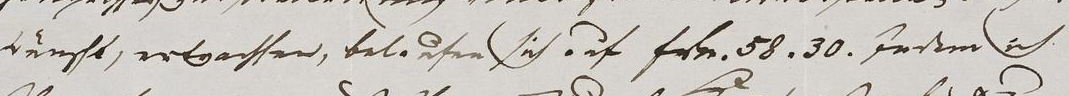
wünscht, erwachsen, belaufen sich auf frkn. 58.30. Indem ich
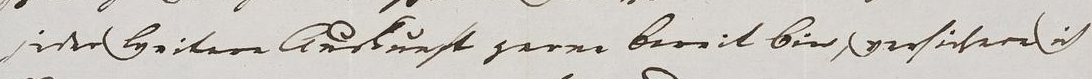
jeder weitern Auskunft gerne bereit bin, versichere ich
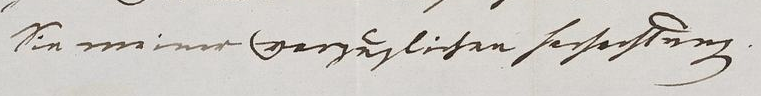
Sie meiner vorzüglichen Hochachtung
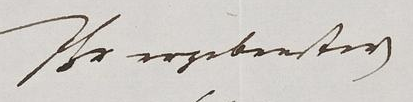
Ihr ergebenster
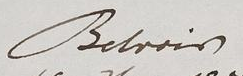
Belvoir
